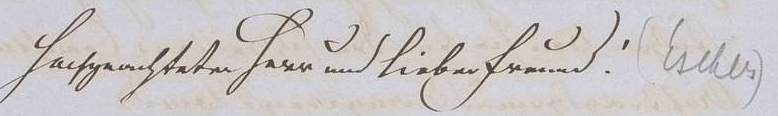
Hochgeachteter Herr und lieber
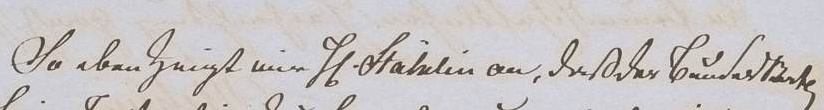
So eben zeigt mir H. Stähelin an, daß der BundesRath
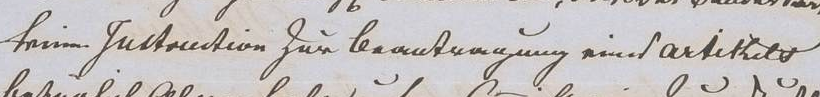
keine Instruction zur Beantragung eines Artikels
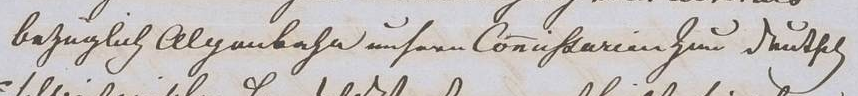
bezüglich Alpenbahn unsern Commissarien zum deutsch -
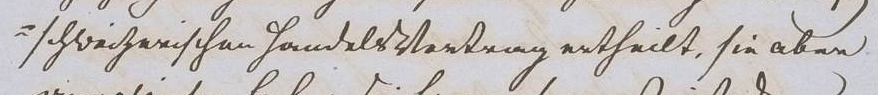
schweizerischen HandelsVertrag ertheilt, sie aber
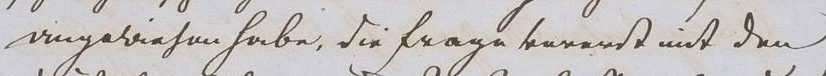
angewiesen habe, die Frage vorerst mit den
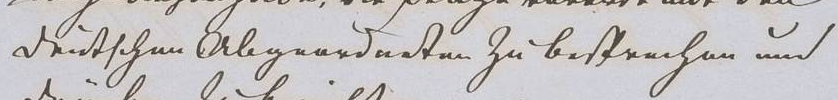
deutschen Abgeordneten zu besprechen und
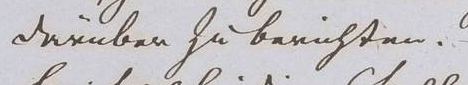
darüber zu berichten. –
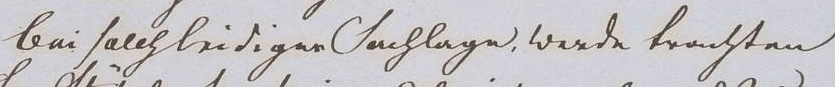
Bei solch leidiger Sachlage, werde trachten
